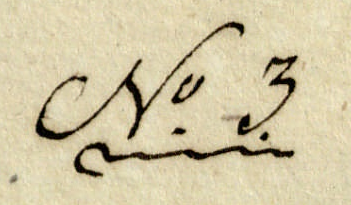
No 3.
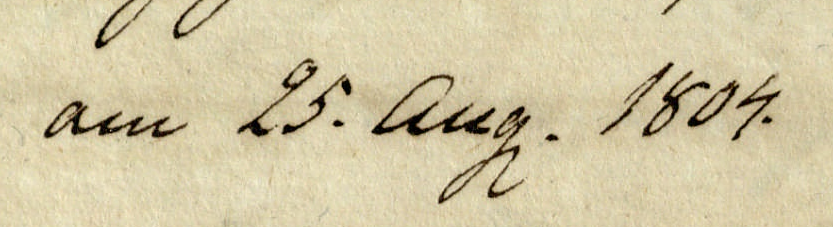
am 25. Aug. 1804.
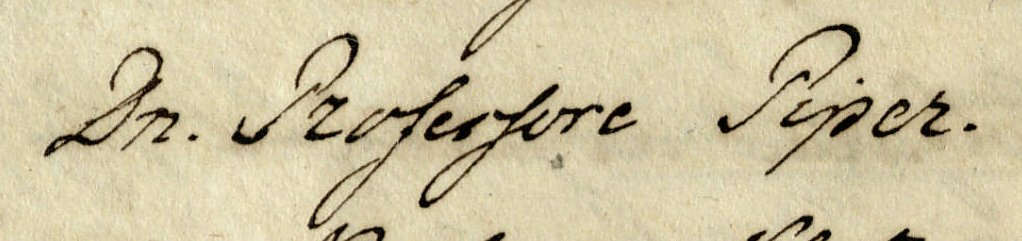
Dn. Professore Piper.
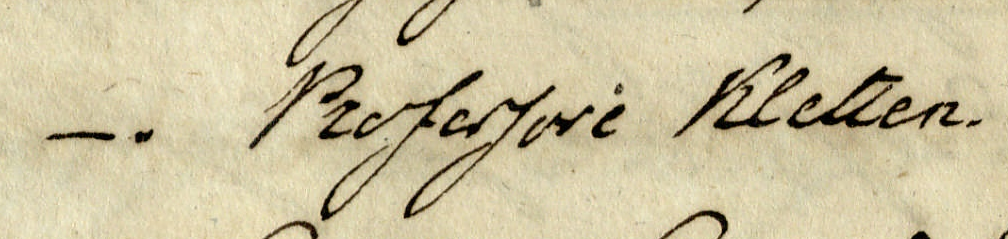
Professore Kletten.
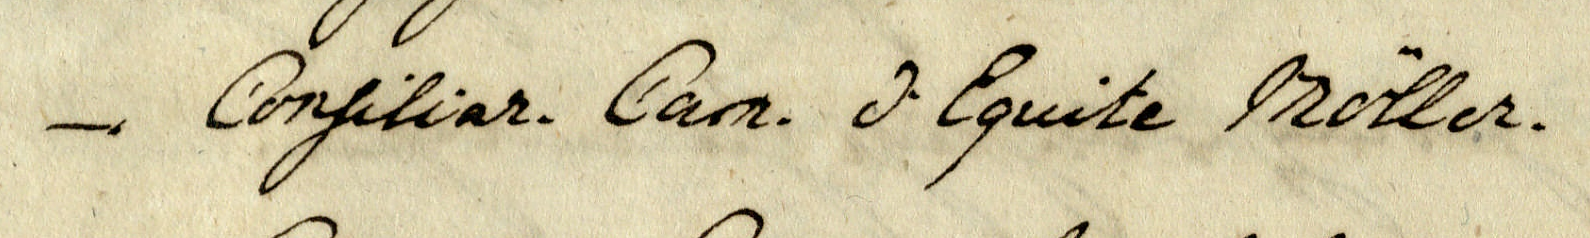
Consiliar. Cam. et Equite Möller.
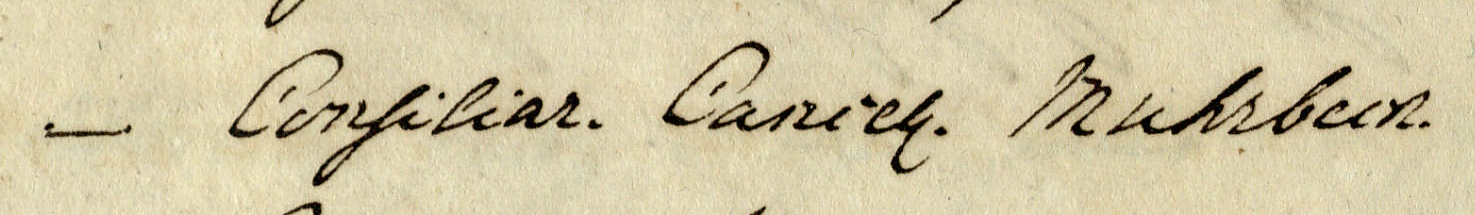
Consiliar. Cancell. Muhrbeck.
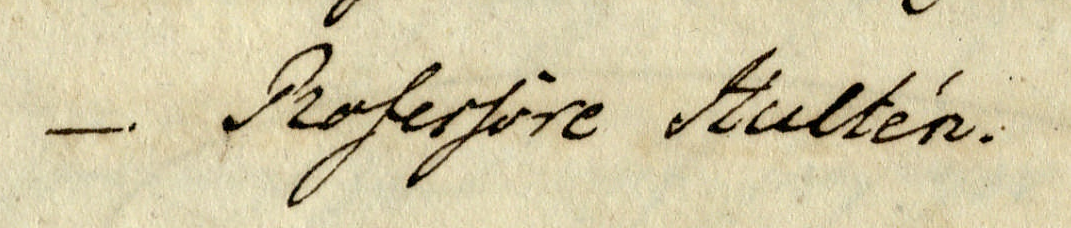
Professore Hultén.
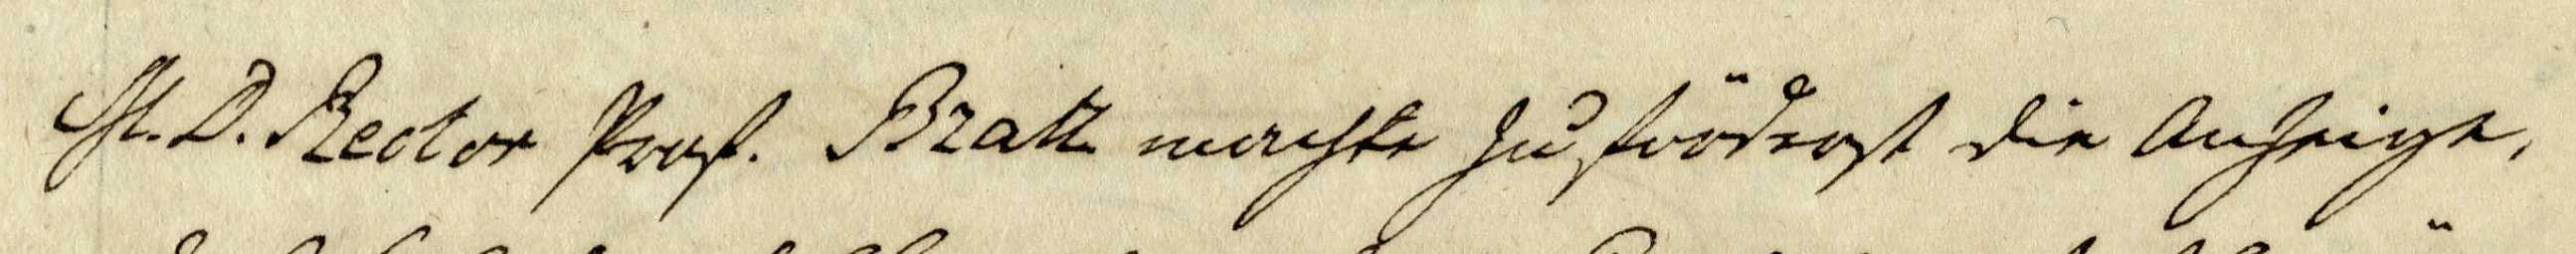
M. D. Rector Prof. Bratt. machte zuförderst die Anzeige,
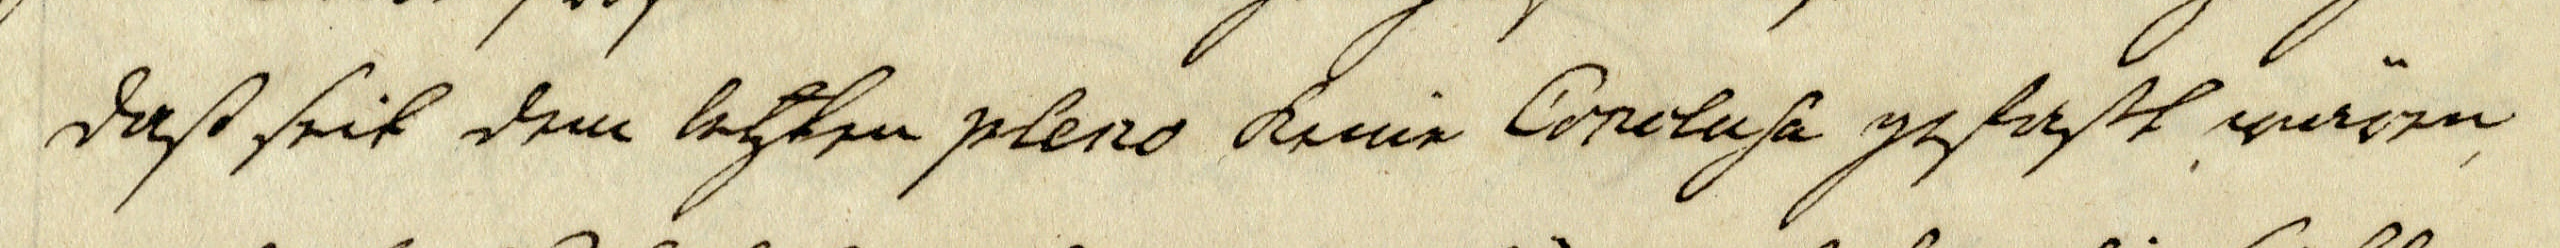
daß seit dem letzten pleno keine Conclusa gefaßt wären
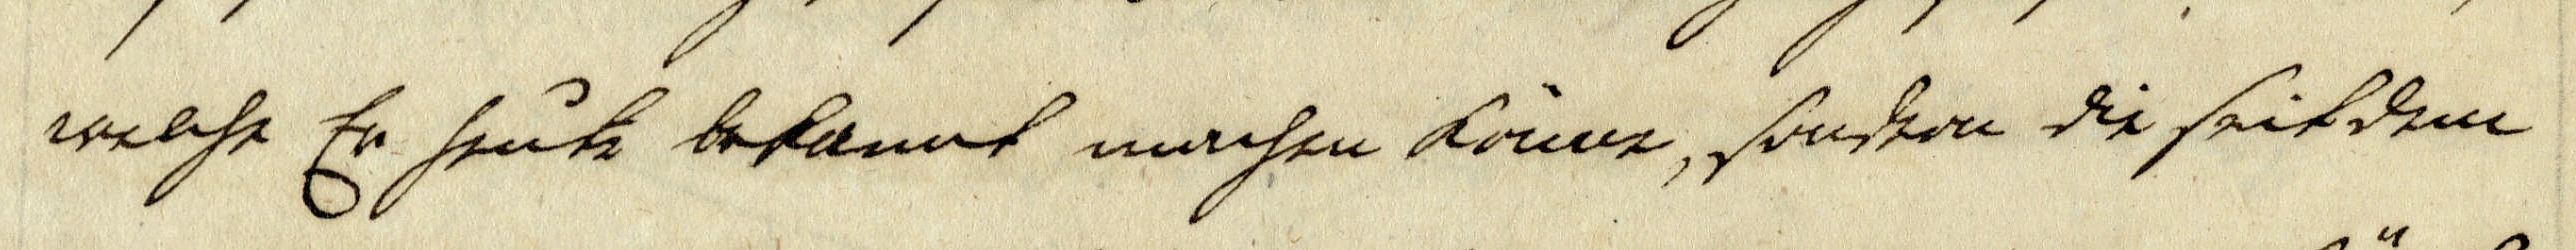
welche Er heute bekannt machen könne, sondern die seitdem
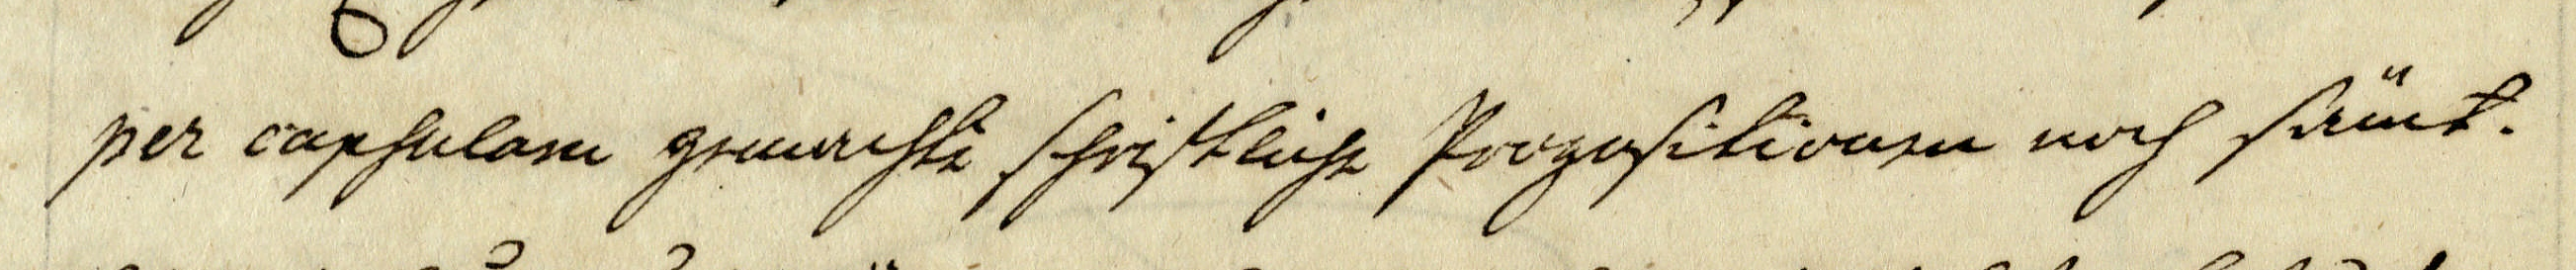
per capsulam gemachte schriftliche Propositionen noch sämt¬
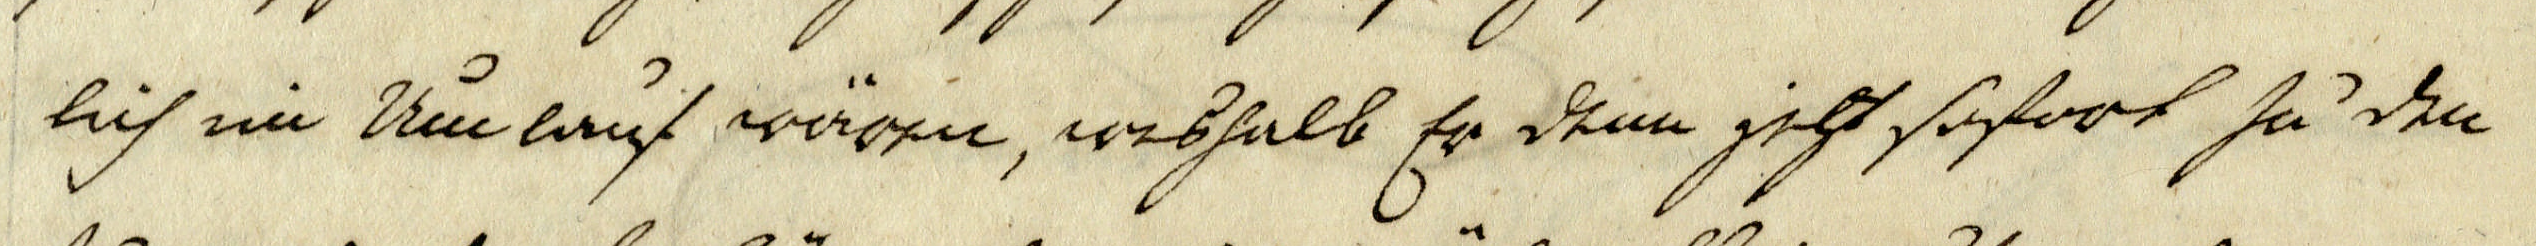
lich im Umlauf wären, weshalb Er denn jetzt sofort zu den
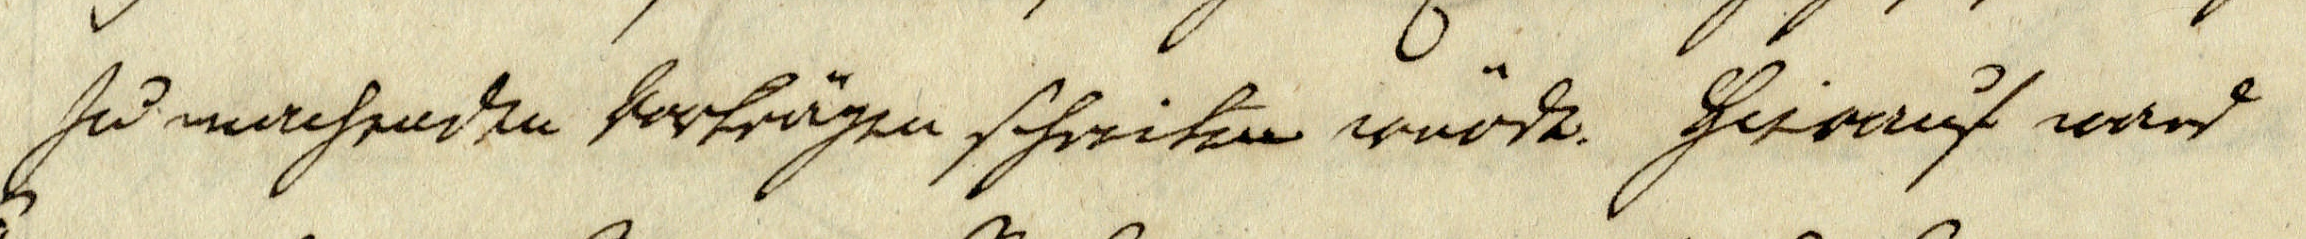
zu machenden Vorträgen schreiten würde. Hierauf ward
